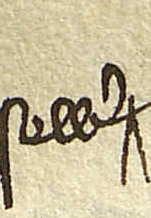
ſelb*
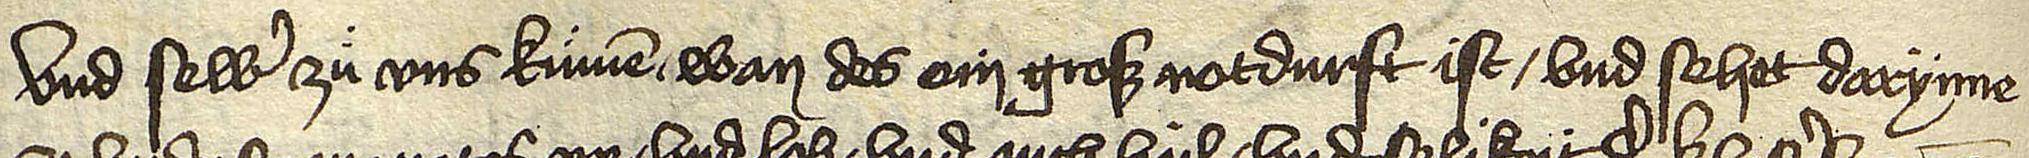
vnd ſelb* cʒü vns küme / wan des ein groſʒ notdurft iſt / vnd ſehet darynne
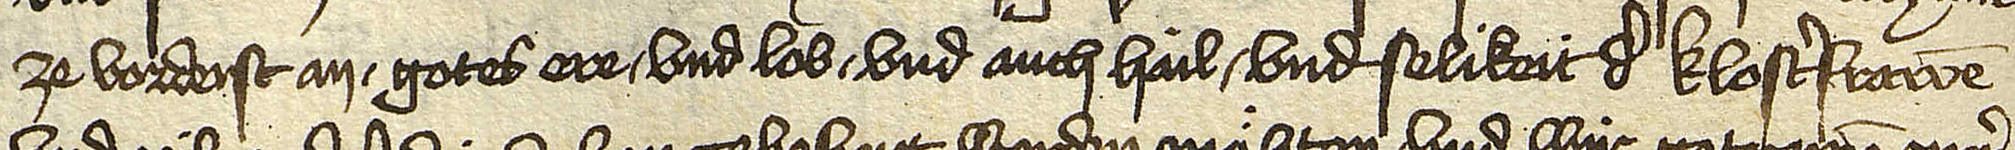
ʒe vorderſt an / gotes ere / vnd lob / vnd auch hail / vnd ſelikeit d* kloſt*frawe*
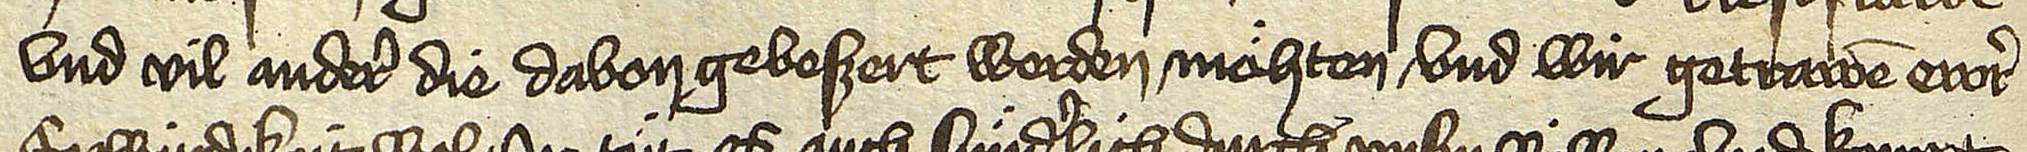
vnd vil ander* die davon gebeſʒert werden möhten / vnd wir getrawe* ewr*
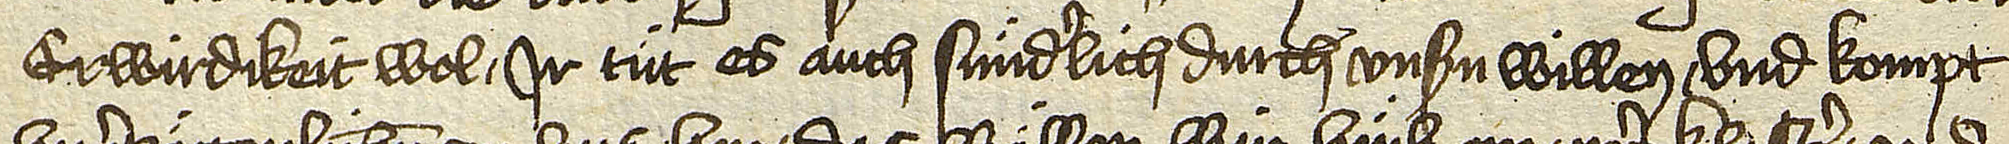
Erwirdikeit wol / Ir tüt es auch ſünd*lich durch vnſ*n willen / vnd kompt
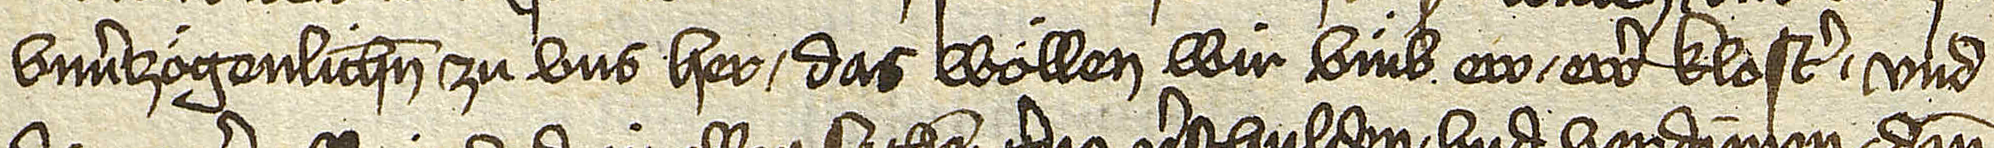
vnu*tʒögenlichn* cʒu vns her / das wöllen wir v̈mb ew / ew* kloſt* / vnd
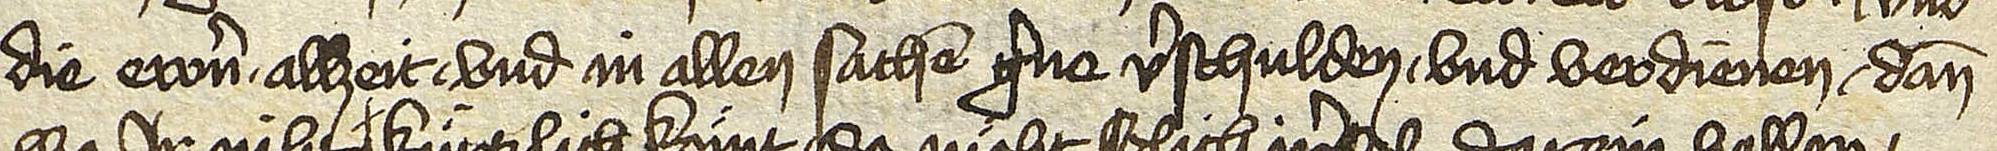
die ewn* / allcʒeit / vnd in allen ſache* g*ne v*ſchulden / vnd verdienen / dan*
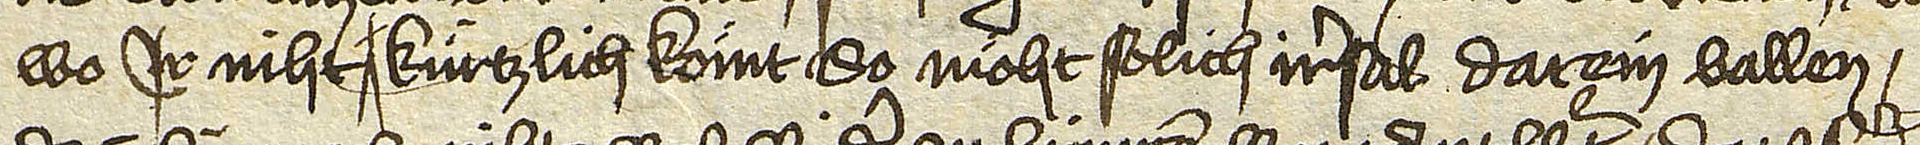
wo Ir niht kürtʒlich kömt / So möht ſolich ir*ſal darein vallen /
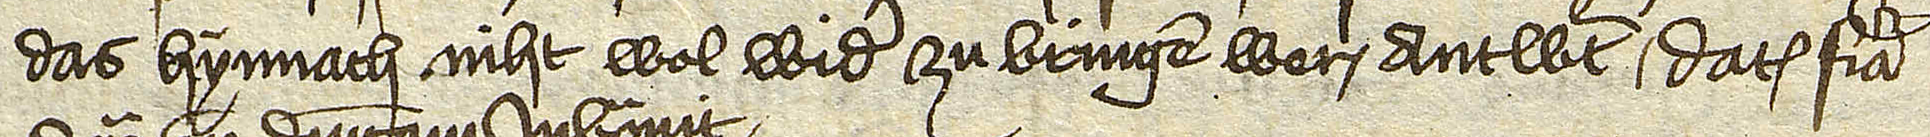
das hynnach niht wol wid*cʒu bringe* wer / Antw*t / dat* fia*
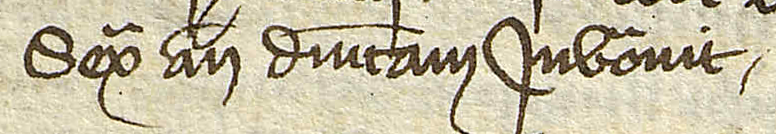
Sex* an* dincam* Inuo*uit /
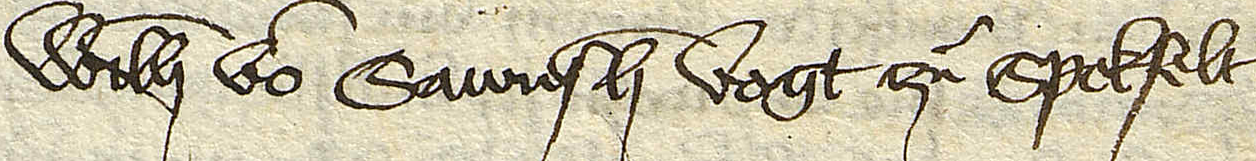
Wilh* vo* Sawnſh* Vogt cʒü Spekfelt
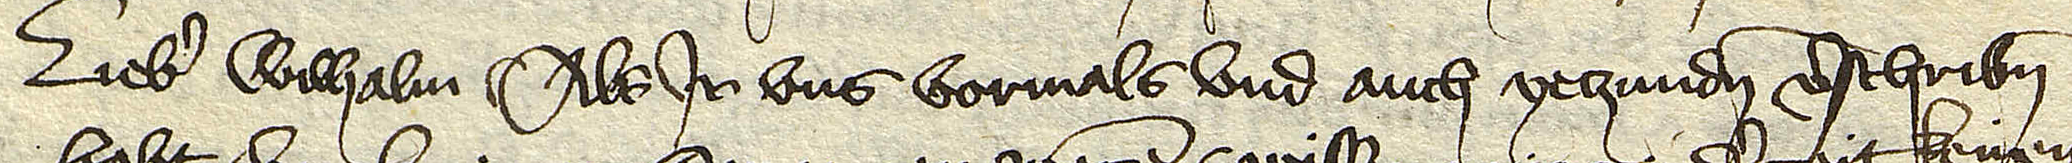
Lieb* wilhalm / Als Ir vns vormals vnd auch yecʒundn* v*ſchribn*
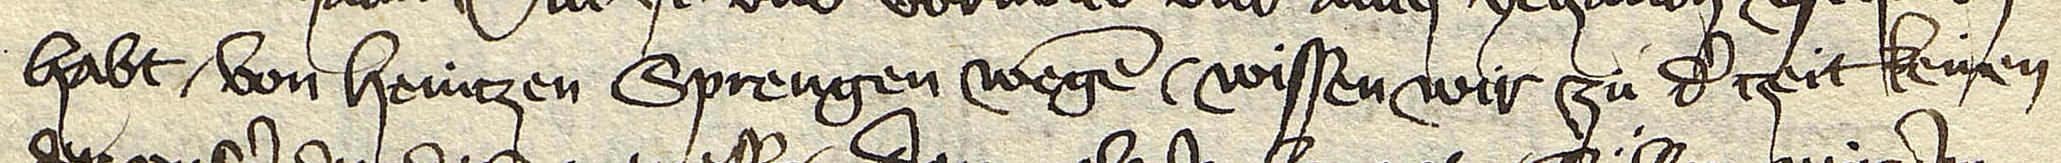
habt / von heincʒen Sprengen wege* / wiſſen wir cʒü d* cʒeit keinen
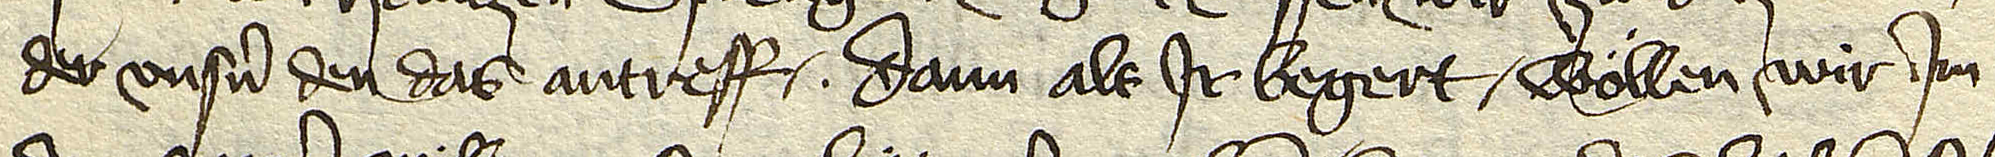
der vnſn* den das antreff / . Dann als Ir begert / wöllen wir Im
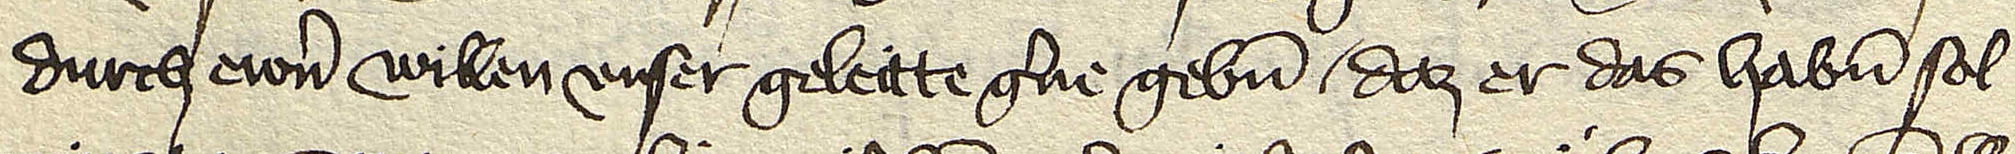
durch ewn* willen vnſer geleitte g*ne gebn* / daʒ er das habn* ſol
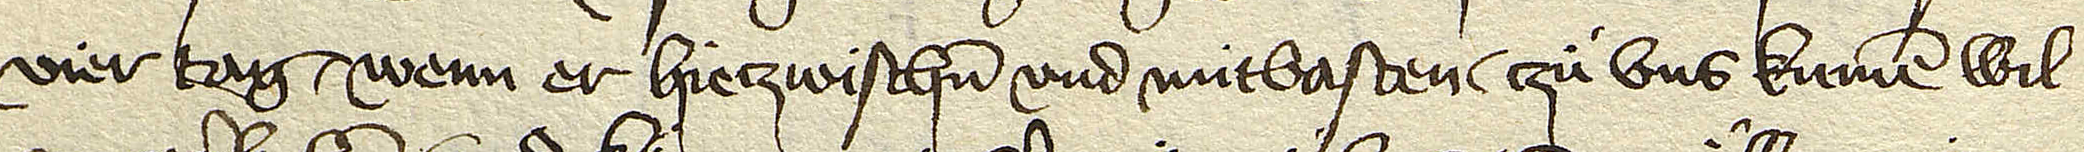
vier tag / wenn er hiecʒwiſchn* vnd mitvaſten / cʒü vns kume* wil
